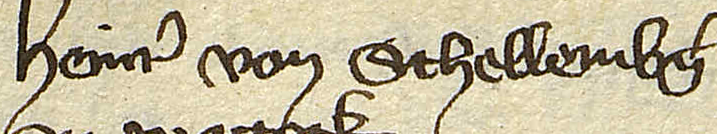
heinr* von Schellembg*
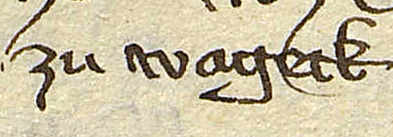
cʒu wageck
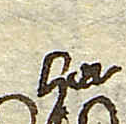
her
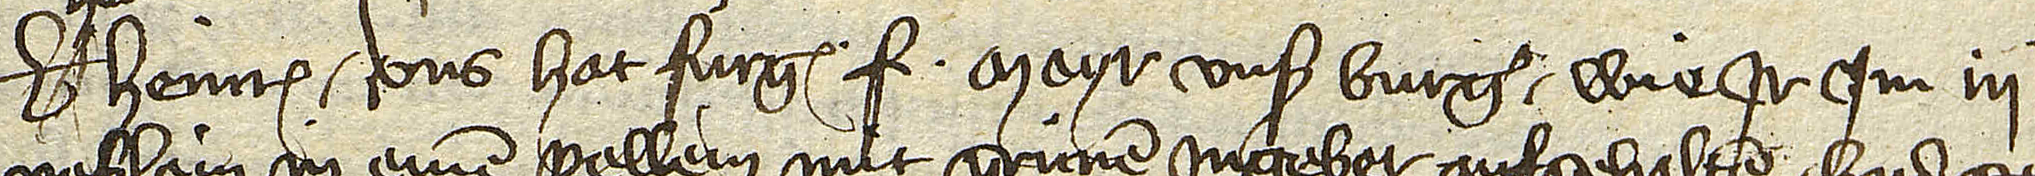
L* heinr* / Vns hat fürg* f . Meyr vnſ* burg* / wie Ir Im iii
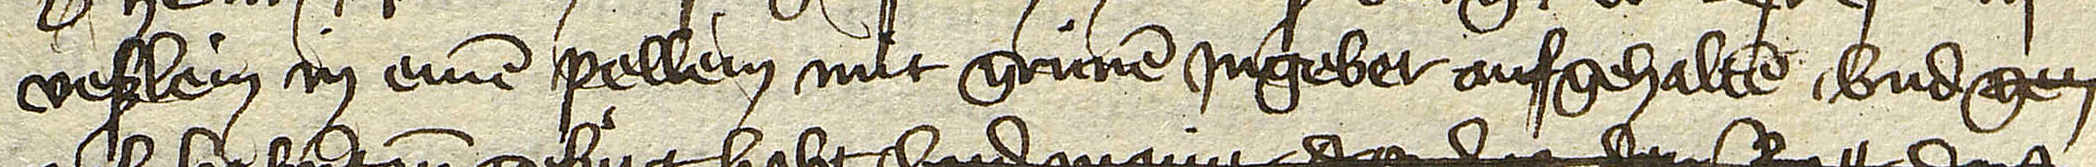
veſʒlein in eine* pellein mit grüne* Ingeber aufgehalte* / vnd gen
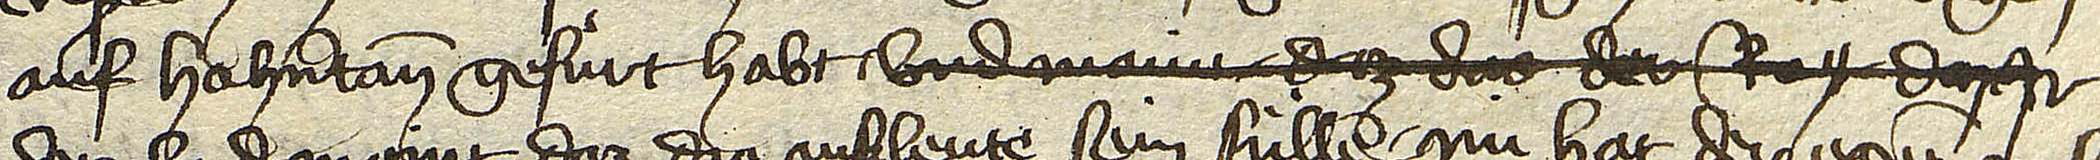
auf hohn*tan* gefürt habt / vnd maint / daʒ das der Ro* daʒ Ir
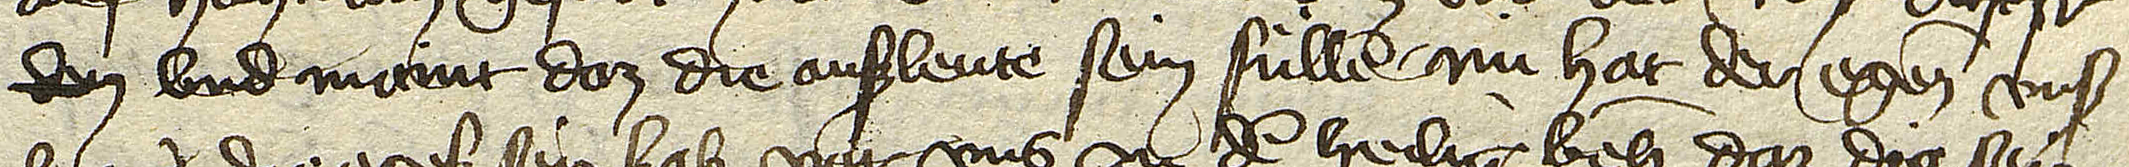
den vnd maint daʒ die auſʒleute ſein ſülle* / Nu hat der egen* vnſ*
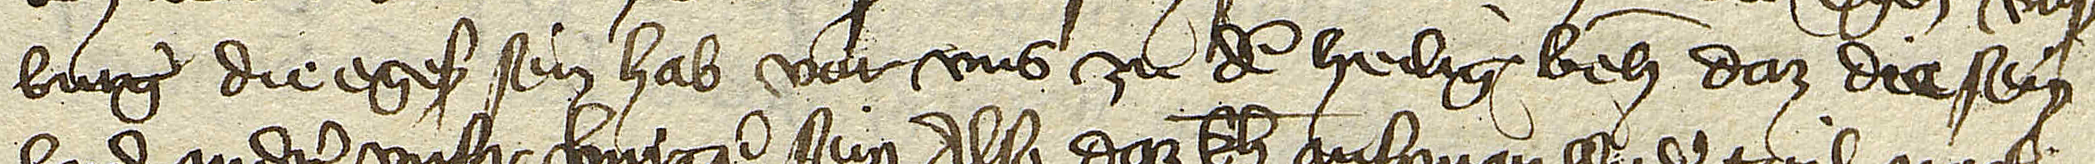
burg* die egeſ* ſein hab vor vns cʒu d* heilige beh* daʒ die ſein
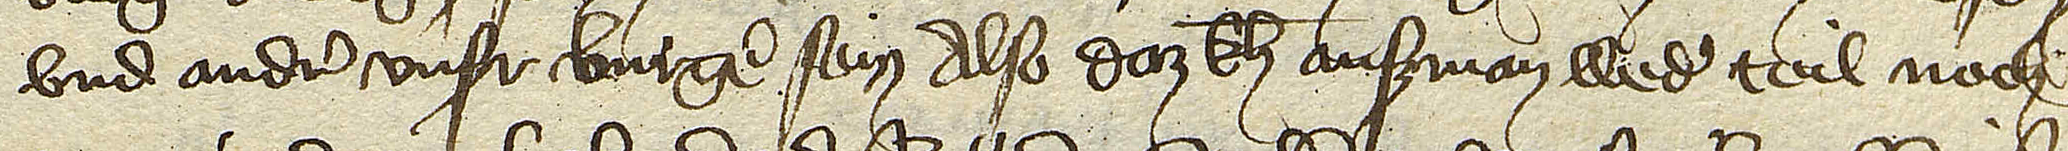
vnd andr* vnſ*r / burge* ſein Alſo daʒ kh* auſʒman wed* teil noch
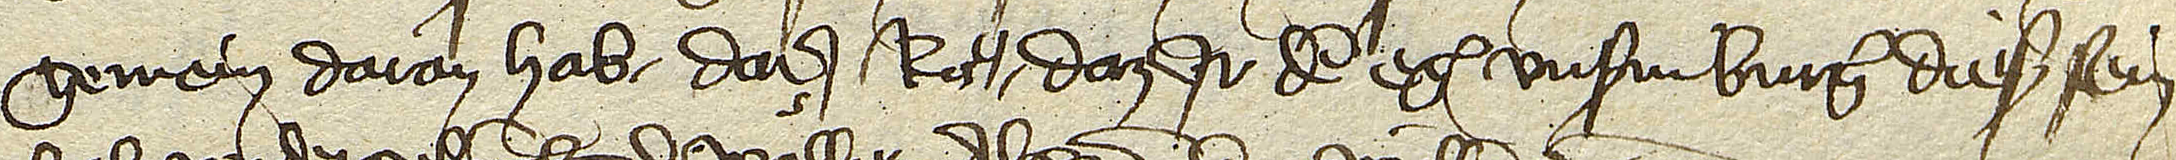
gemein daran hab / da* Ro* / daʒ Ir d* eg* vnſ*m burg* dieſ* ſein
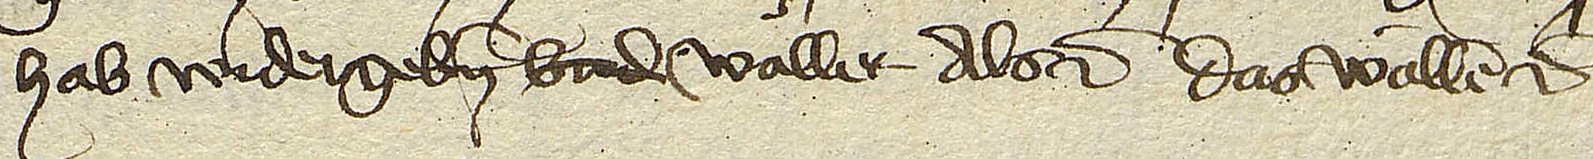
hab widergebn* vnd wöllet Als ec* das wölle* ec*
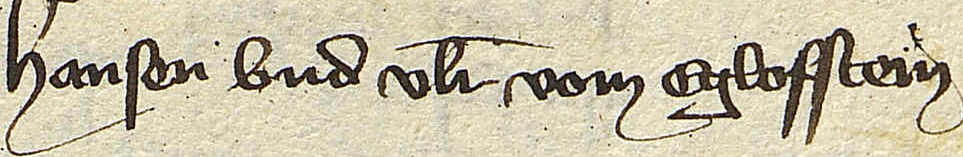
hanſen vnd vlr* vom Eglofſtein
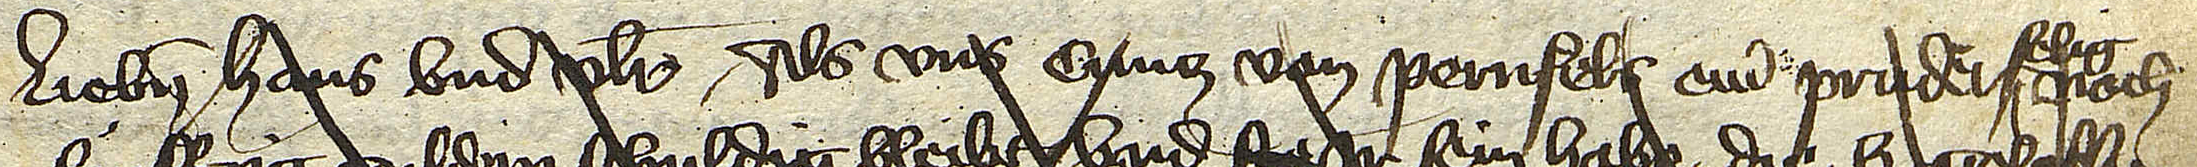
Liebn* hans vnd vlr* / Als vns Cuncʒ von Pernfels ew* pruder noch
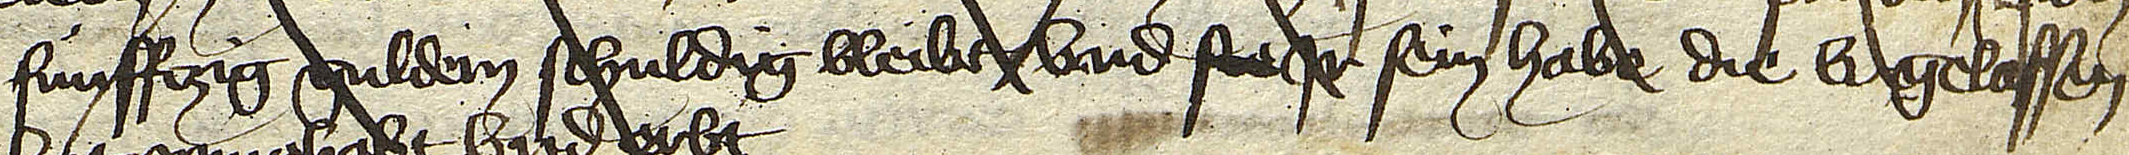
fünffcʒig guldein ſchuldig bleibt vnd ſie Ir ſein habe die Er gelaſſen
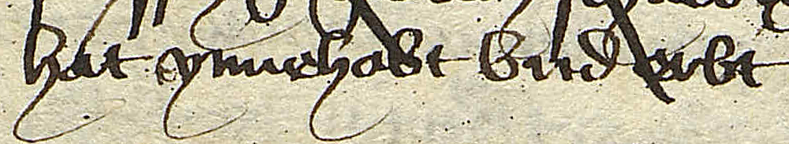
hat ynnehabt vnd erbt
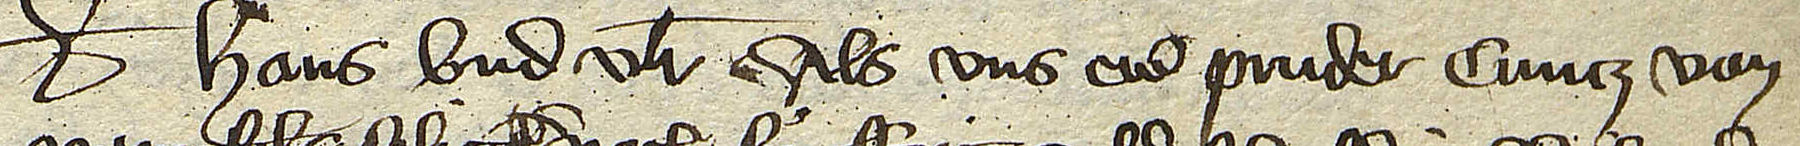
L* hans vnd vlr* / Als vns ew* pruder Cuncʒ von
